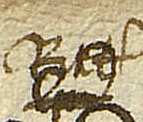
Ritt*
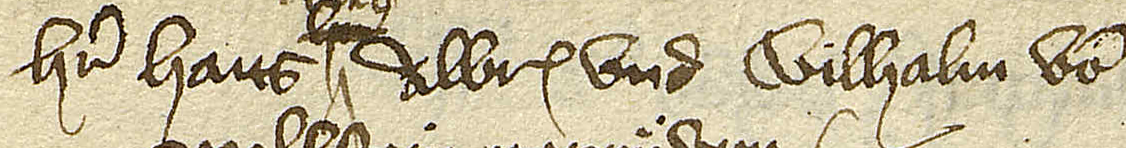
hr* hans Albr* vnd Wilhalm vo*
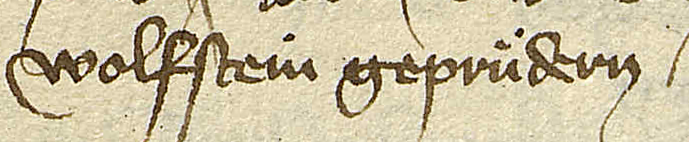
wolfſtein geprüdern /
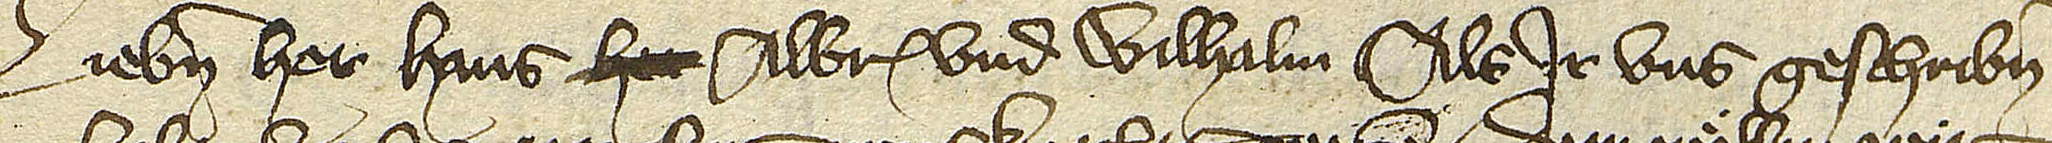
Liebn* her hans her Albr* vnd Wilhalm / Als Ir vns geſchribn*
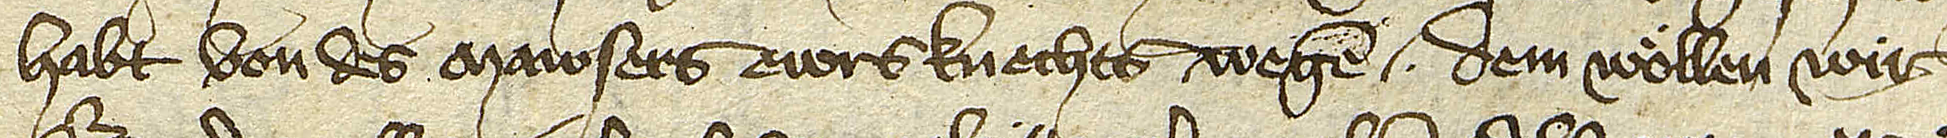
habt von des Mawſers ewrs knechts / wege* / . dem wöllen wir
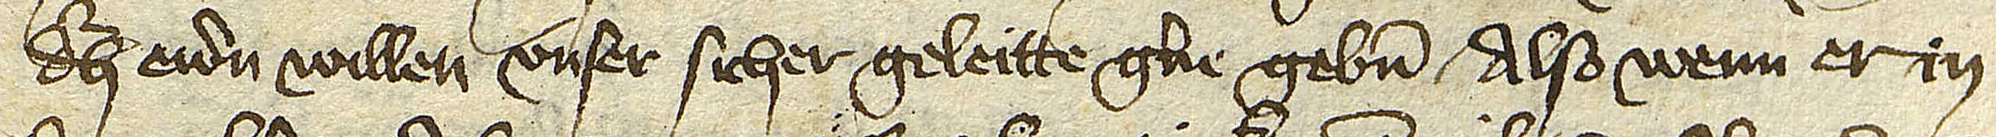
d*h ew*n willen vnſer ſicher geleitte g*ne gebn* / Alſo wenn er in
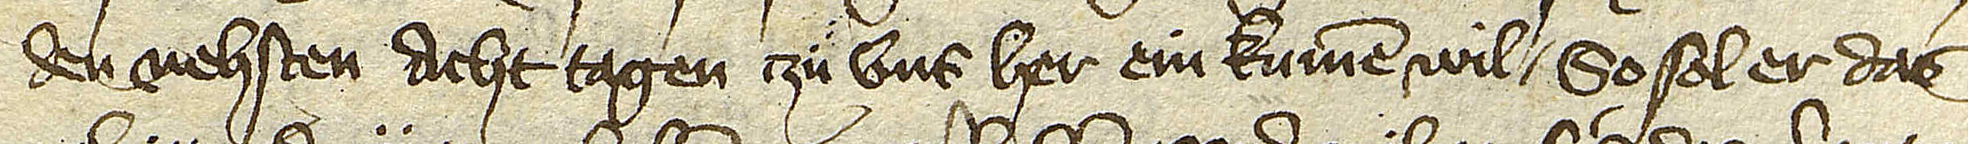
den nehſten Acht tagen cʒü vns her ein kume* wil / So ſol er das
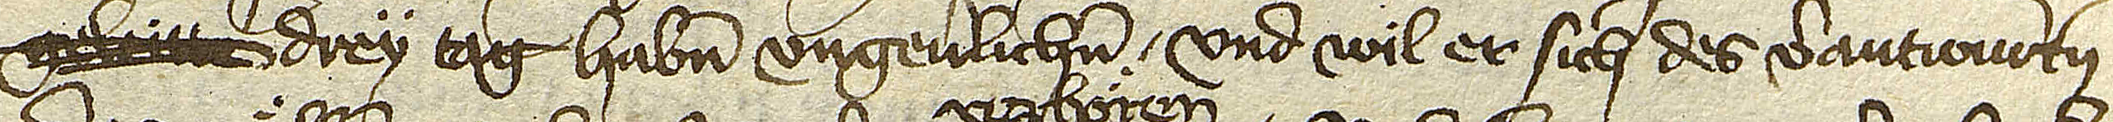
geleitte drey tag habn* vngeu*lichn* / vnd er ſich des v*antwurtn*
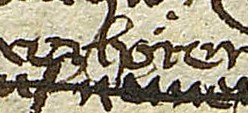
verhören
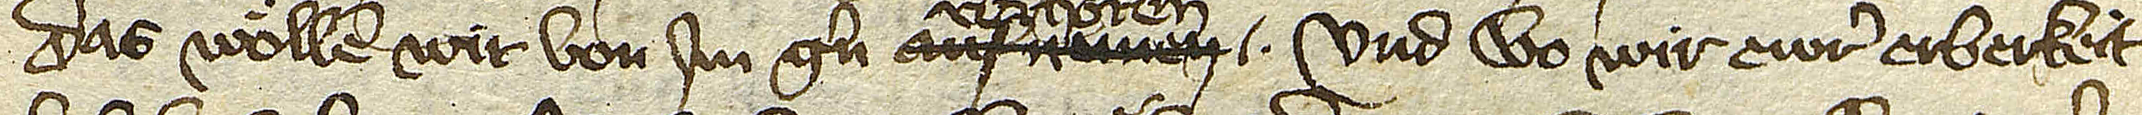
Das wölle* wir von Im g*n aufnemen / . vnd wo wir ewr* erberkeit
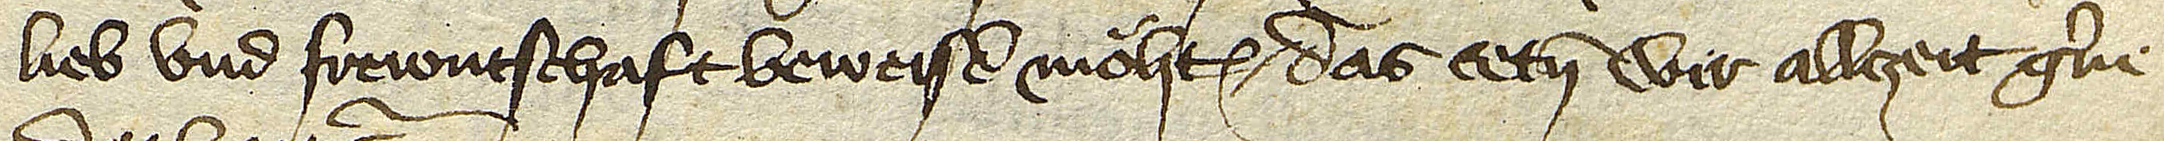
lieb vnd frewntſchaft beweiſe* möht* / das tetn* wir allcʒeit g*ne
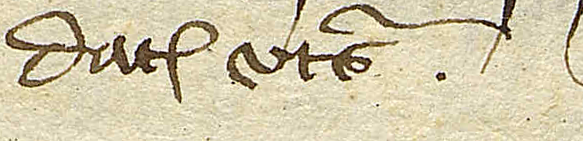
Dat* vts* / .
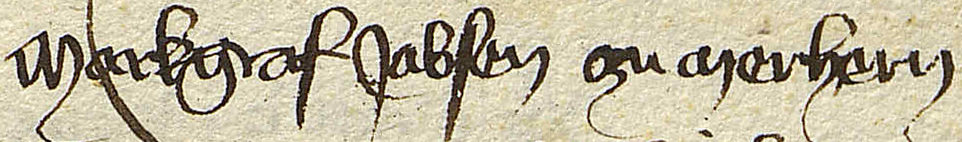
Markgraf Iobſen cʒu Merhern
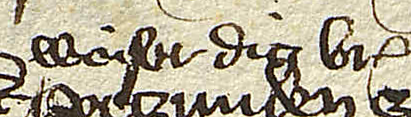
weiſer dicʒ br*
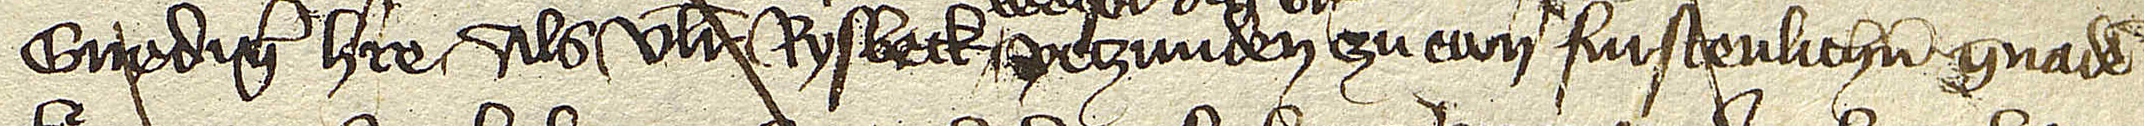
Gnedig* h*re / Als vlr* Ryſbeck yecʒunden cʒu ewn* fürſtenlichn* gnade*
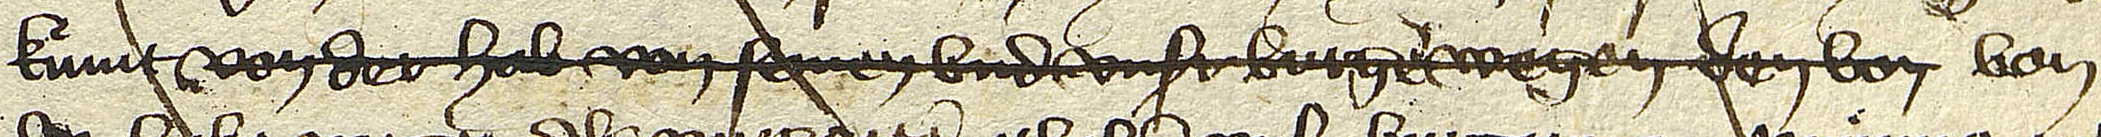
kümt von der hab von ſeinen vnd vnſ*r burge* wegen den von von
